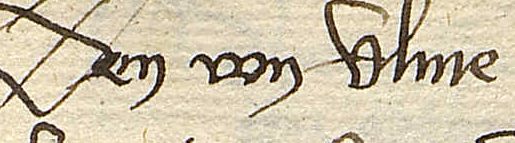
Den von Vlme
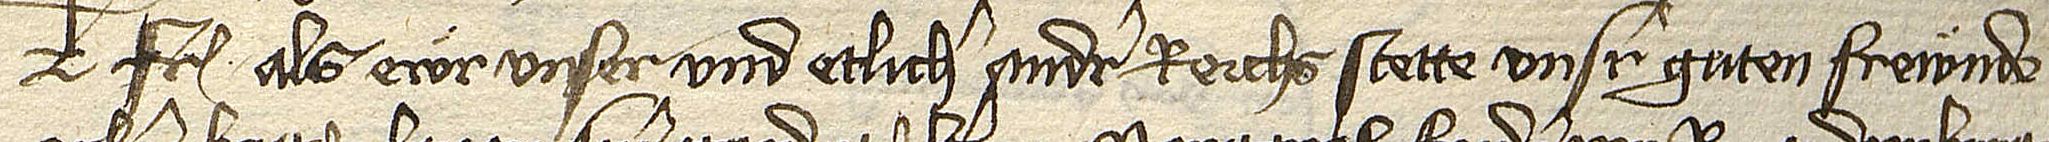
L* Fr* / als eẅr vnſer vnd etlich* andr* Reichs ſtette vnſr* guten freẅnde
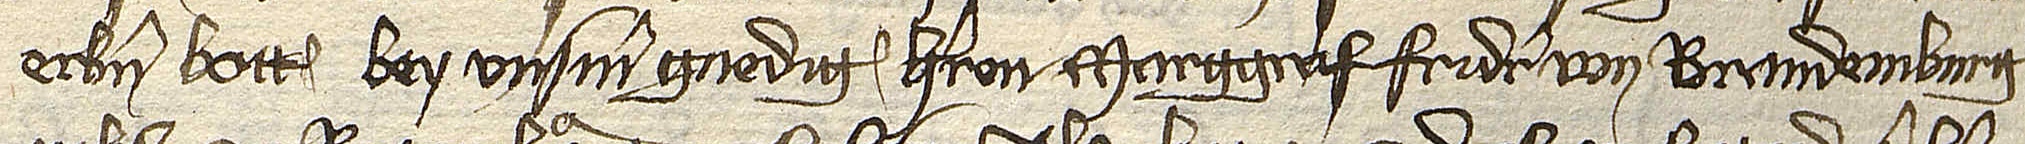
erbn* bott* bey vnſm* gnedig* h*ren Marggraf fridr* von Brandemburg
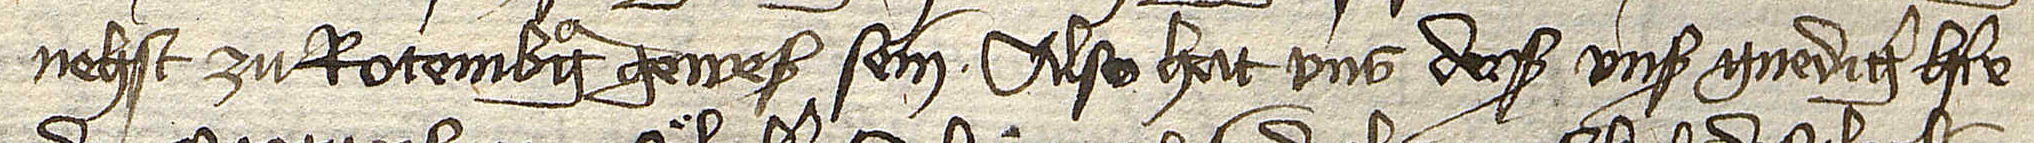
nehſt ʒu Rotemb*g geweſ* ſein . Alſo hat vns derſ* vnſ* gnedig* h*re
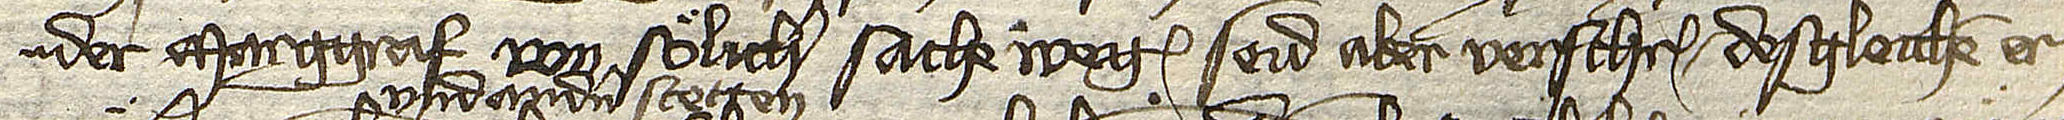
~ der Marggraf von ſölich* ſache weg* ſeid aber verſchr* / deſgleiche* er
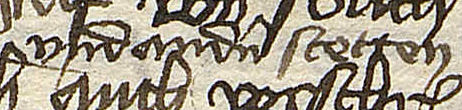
vnd andn* ſtetten
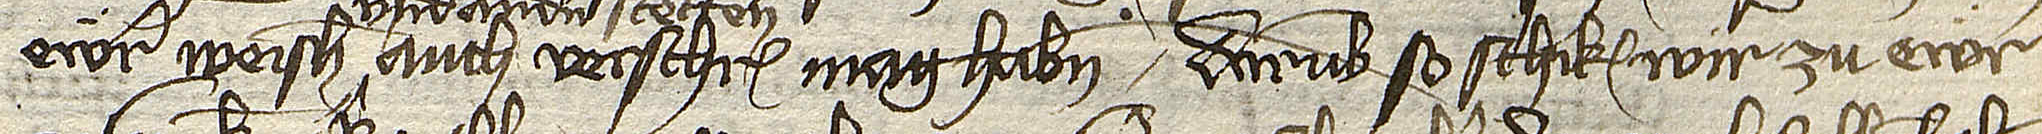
eẅr* weiſh* auch verſchr* mag habn* / Darub* ſo ſchik* wir ʒu eẅr*
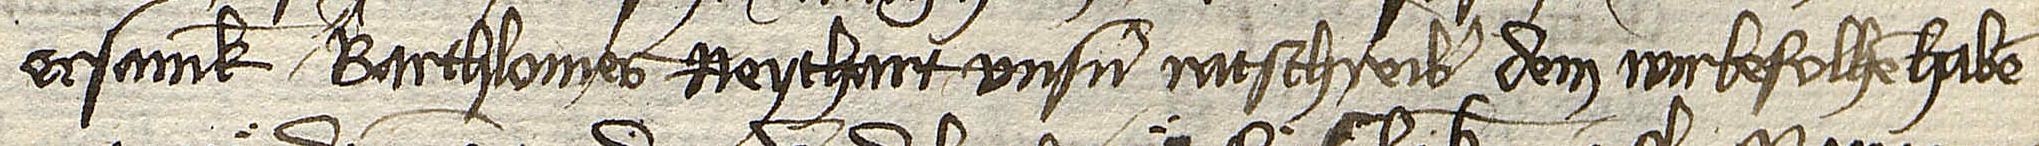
erſamk* / Barthlomes Neythart vnſn* ratſchreib* dem wir befolhe* habe*
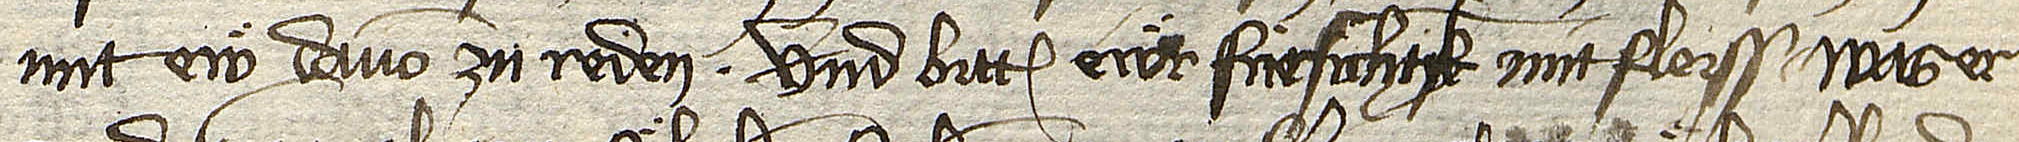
mit eẅ dauo* ʒu reden . Vnd bitt* eẅr fürſichtik* mit fleiſſ / was er
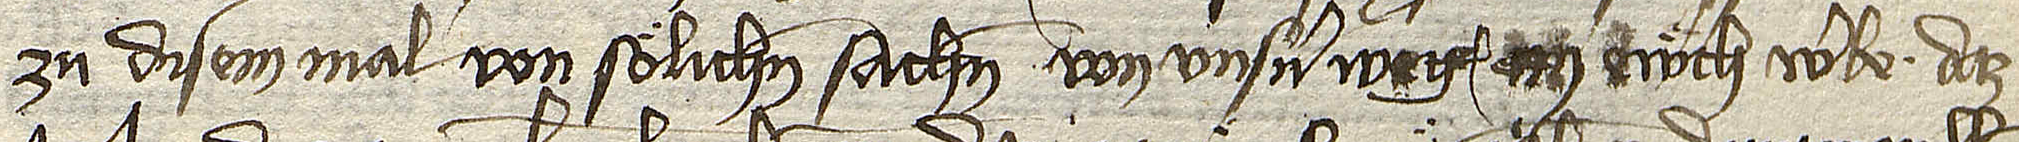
ʒu diſem mal von ſölichn* ſachn* von vnſn* weg* an eẅch w*be . daʒ
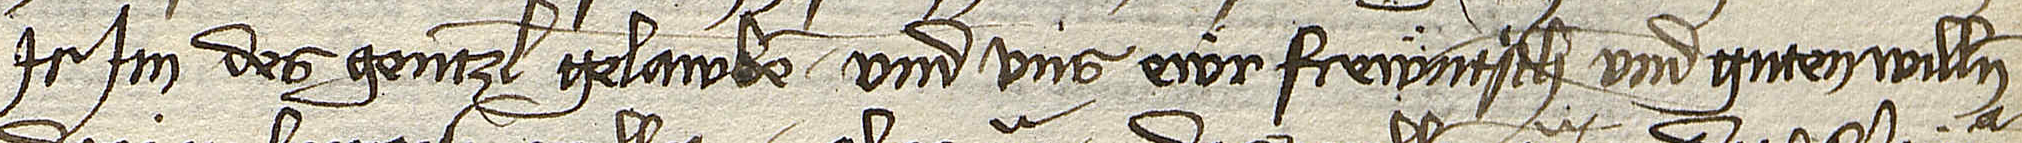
Ir Im des gencʒl* gelawbe* / vnd vns eẅr freẅntſch* vnd guten willn*
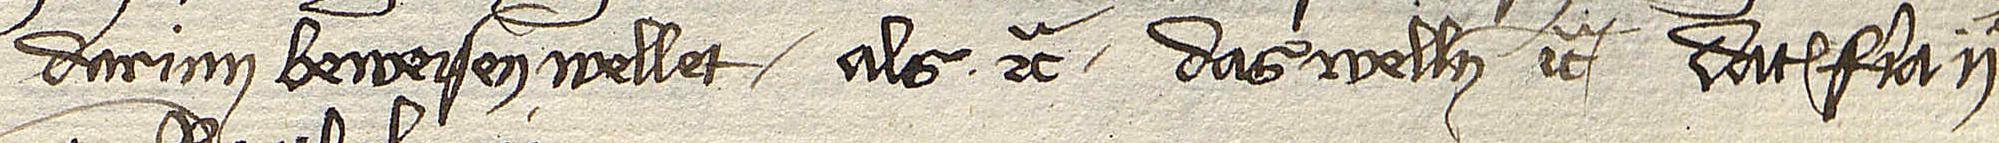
darinn beweiſen wellet / als ec* / Das welln* ec* Dat* fi*a ii*
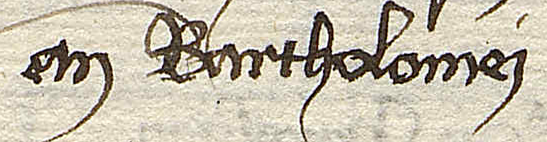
an* Bartholomei
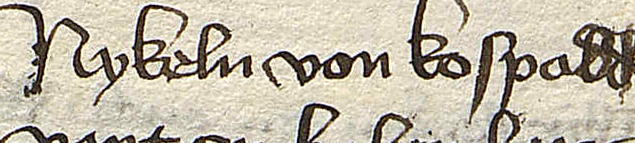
Nykeln von Koſpa%%
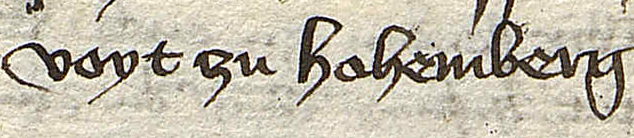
voyt cʒu hohemberg
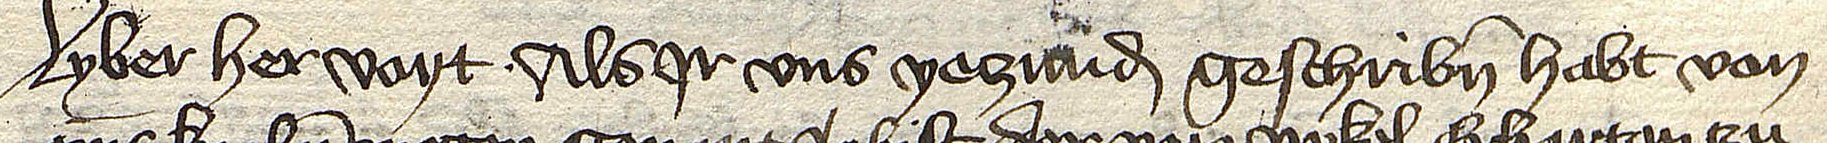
Lyber her voyt . Als Ir vns yecʒund* geſchribn* habt von
